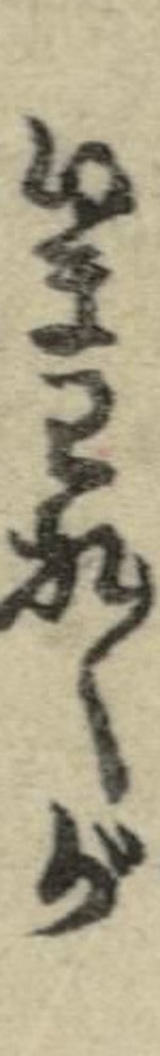いまわれ〳〵が
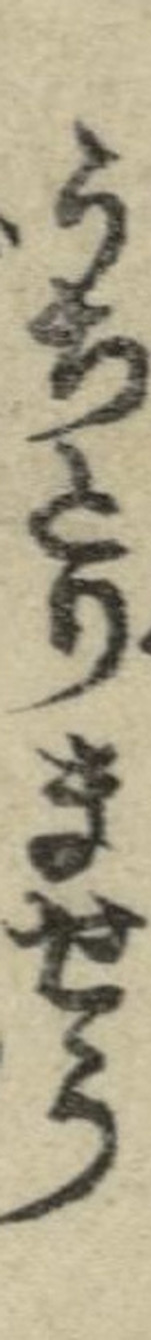うちとりませう
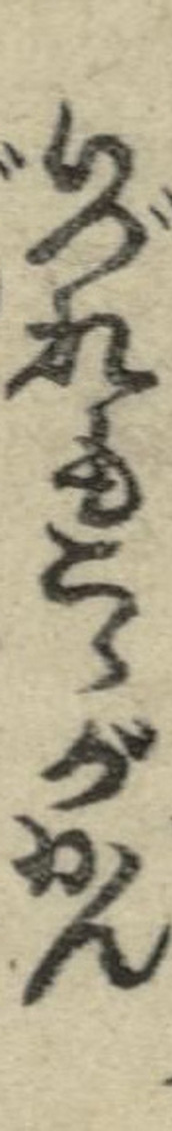いづれもこゝがかん
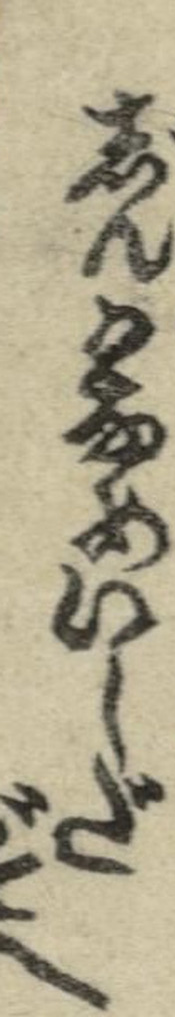じんかなめいしだ
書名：入用御間商賣競
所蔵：東京大学地震研究所図書室 Earthquake Research Institute Library, The University of Tokyo, JAPAN
